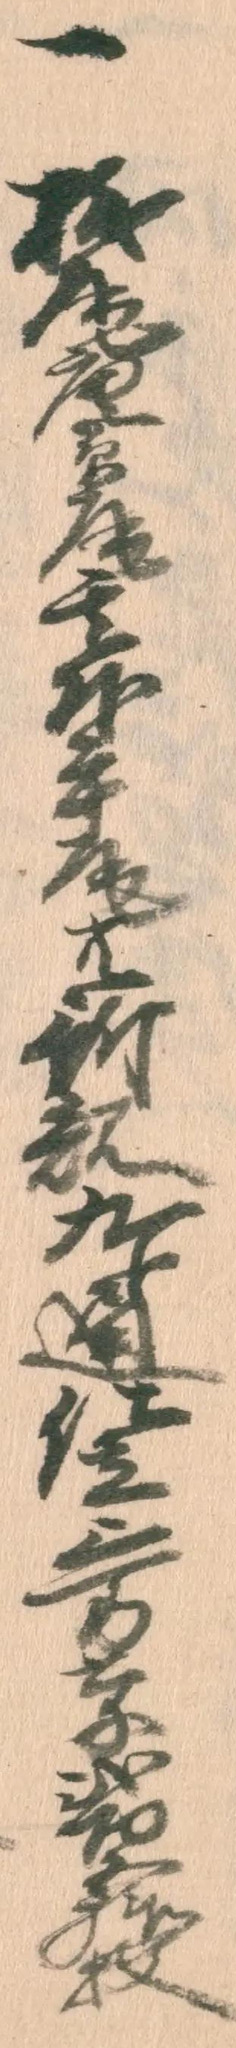一桟瓦唐草瓦其外平瓦共新規九通仕立三万筆弐百五拾枚
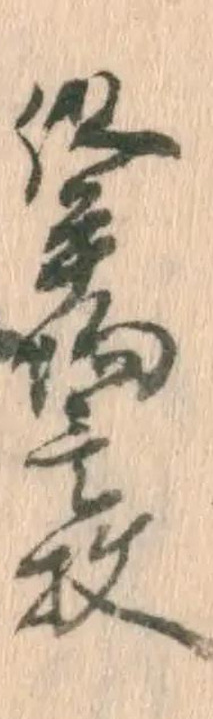但平物壱枚
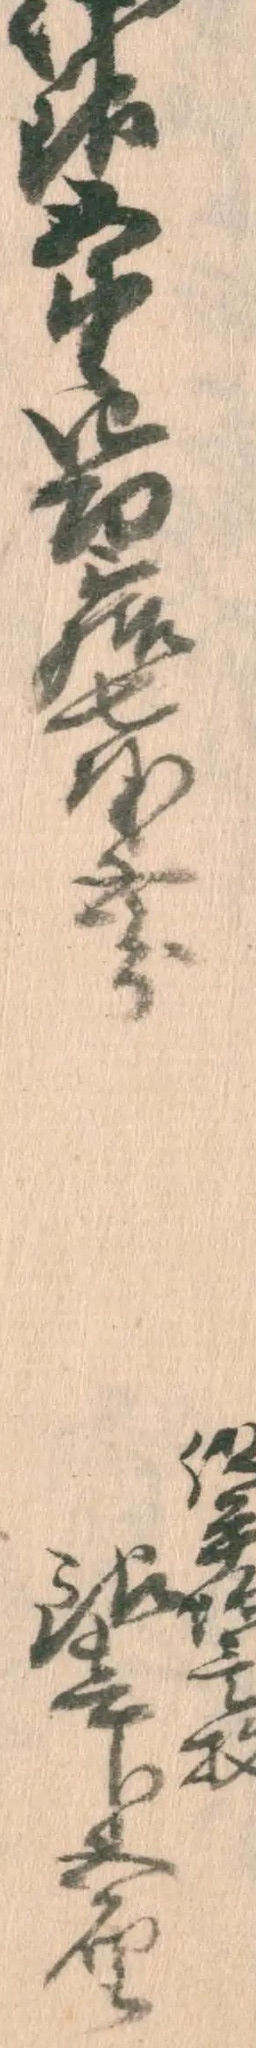代銀五貫四百三拾七匁五分銀壱分五厘
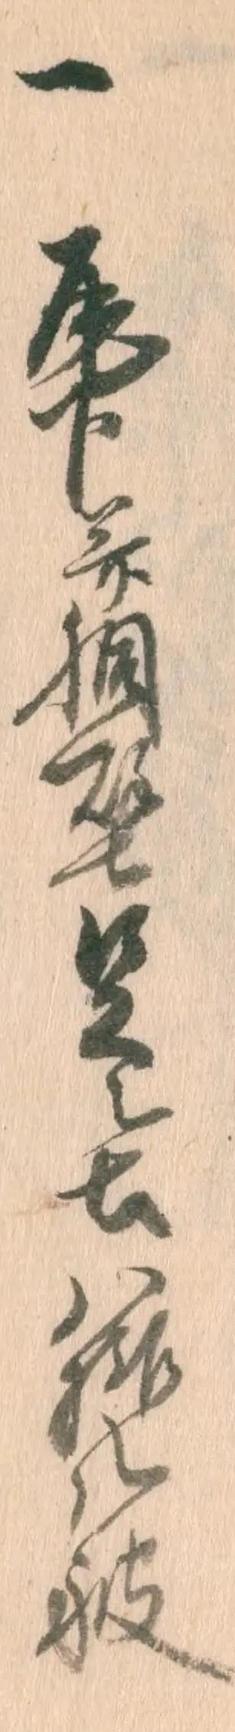一瓦下幷胴壁足し土八拾八艘
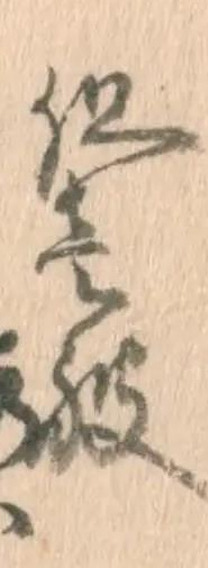但壱艘

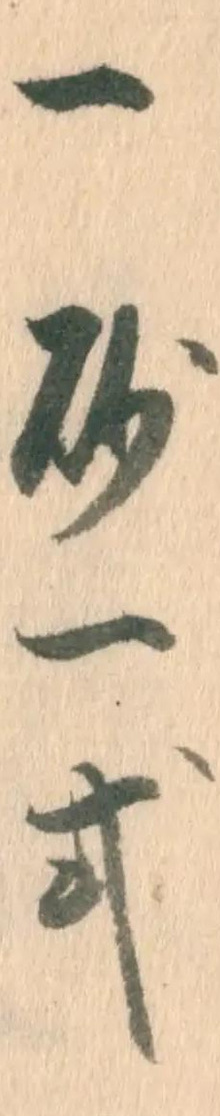一砂一式
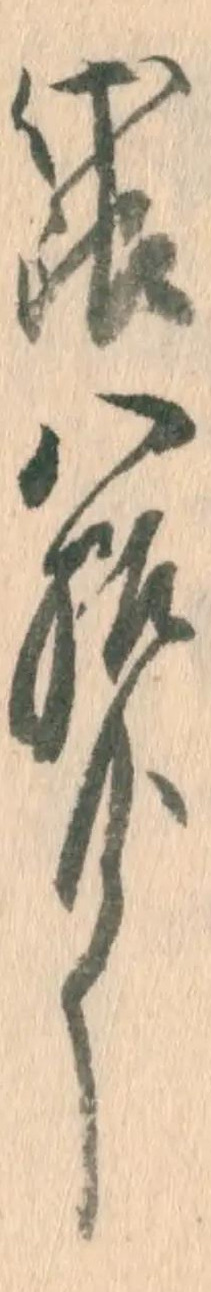代銀八拾匁
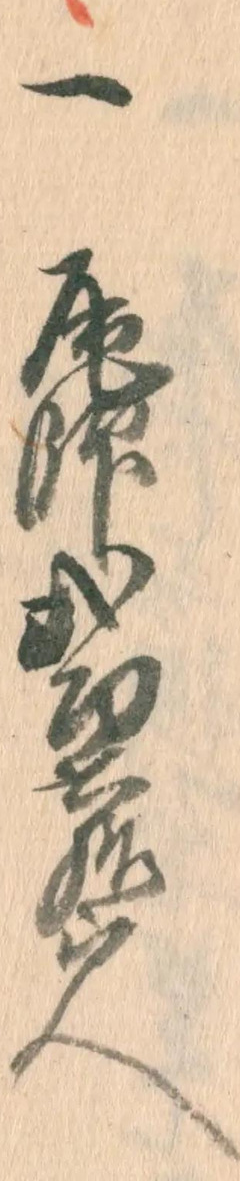一瓦師弐百六拾三人
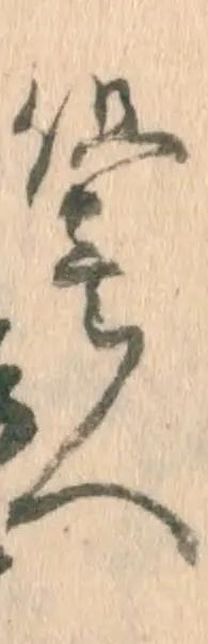但壱人
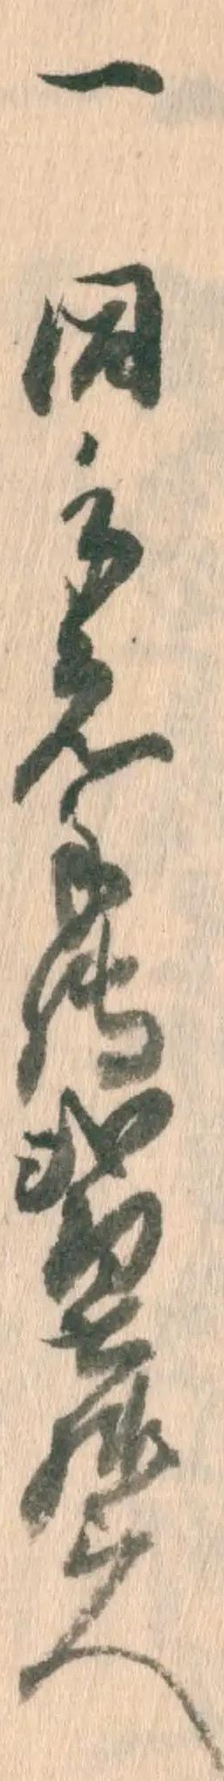一同手元手伝弐百六拾三人
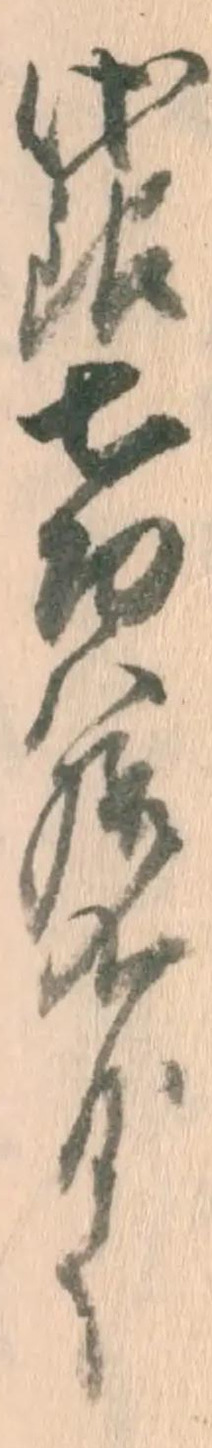代銀七百八拾九匁銀三匁
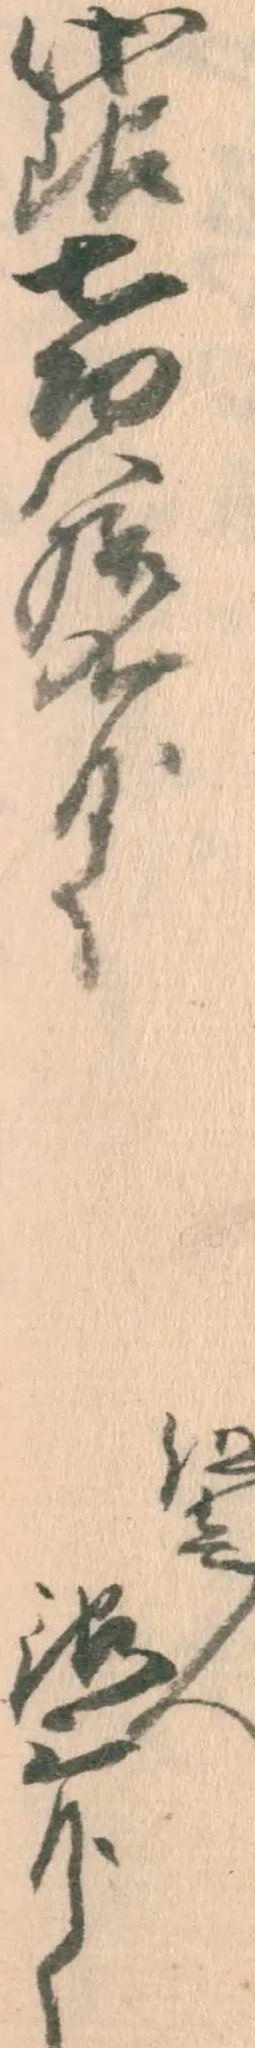代銀七百八拾九匁銀三匁
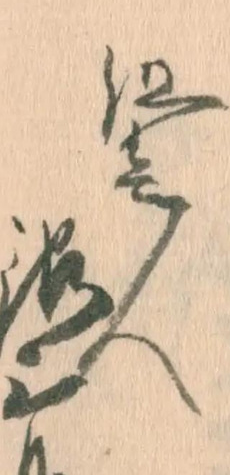但壱人
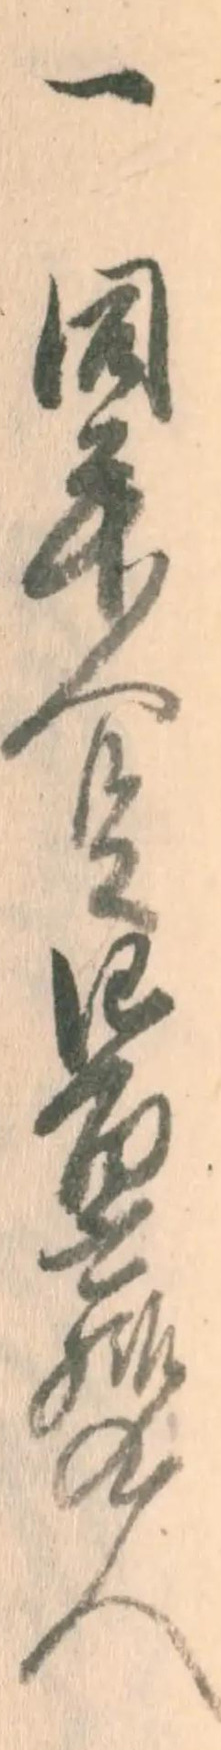一同平人足四百六拾九人
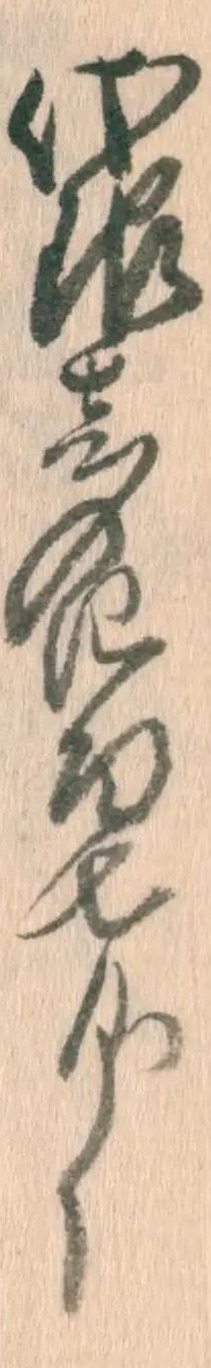代銀壱〆四百七匁銀三匁
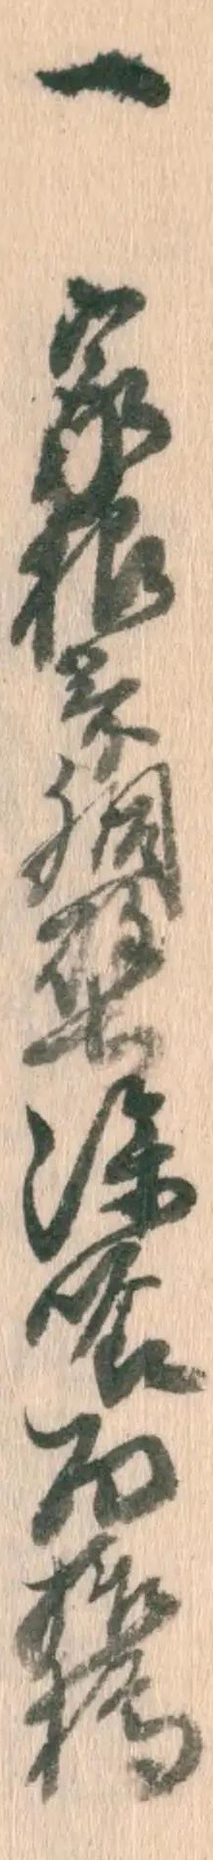一屋根幷胴壁漆喰百拾樽
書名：三十三間堂. [1]
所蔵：国立国会図書館 National Diet Library, JAPAN
